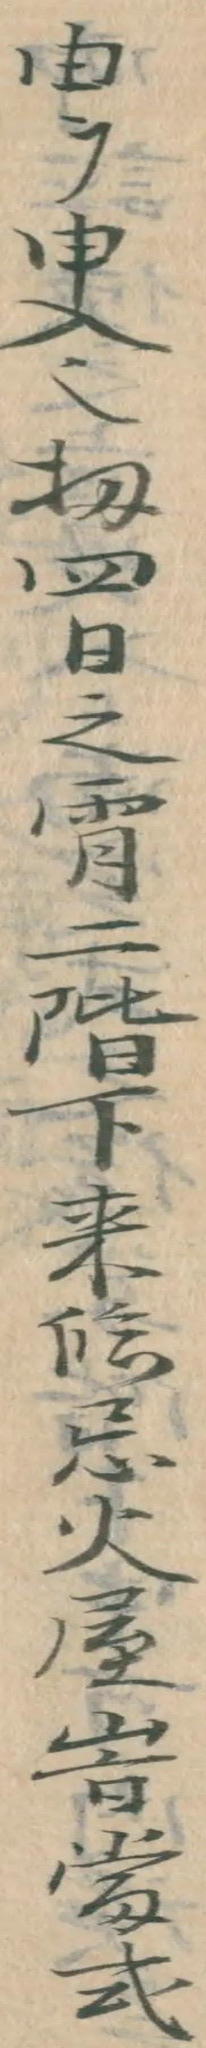由ヲ申入也扨四日之宵二階下来臨忌火屋旹当式
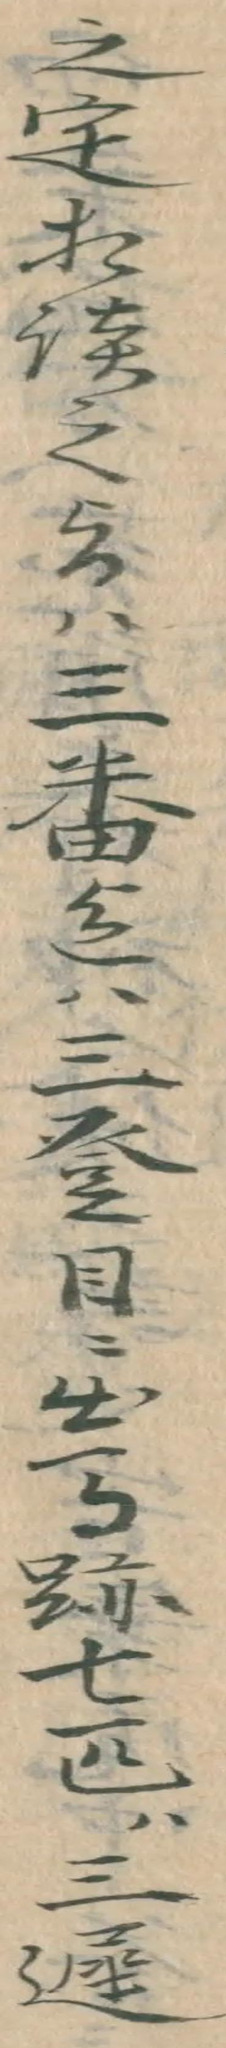之定相談之旨ハ三番迄ハ三登目ニ出馬跡七匹ハ三遅
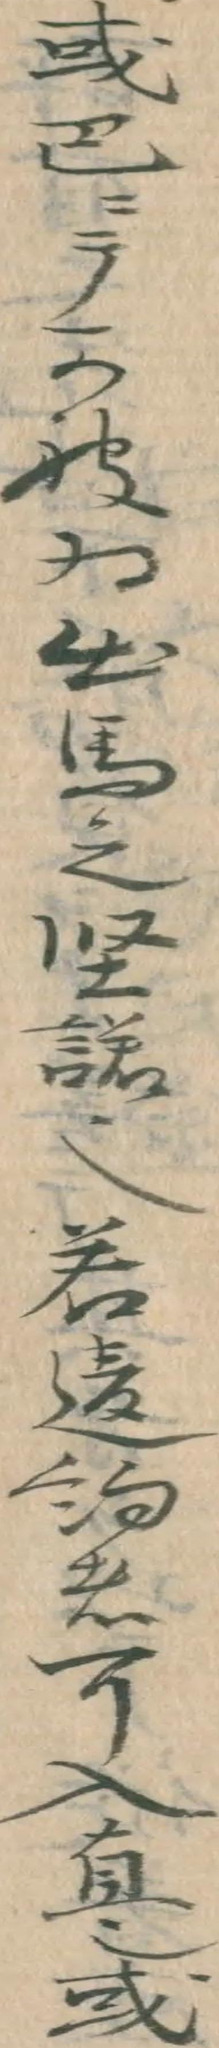或巴ニテ可被為出馬之堅諾也若違約者可入直也或
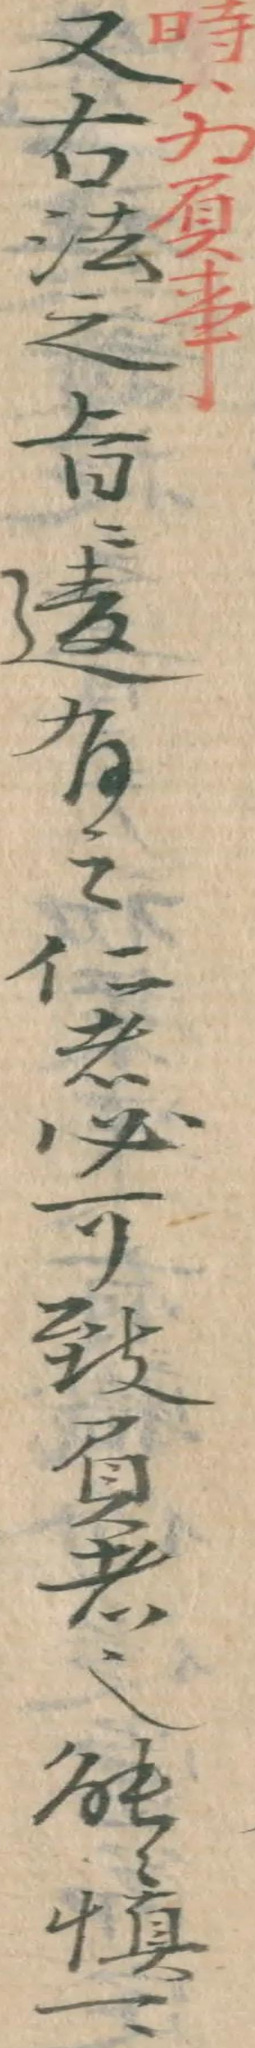又古法之旨ニ違有之仁者必可致負者也能々慎可
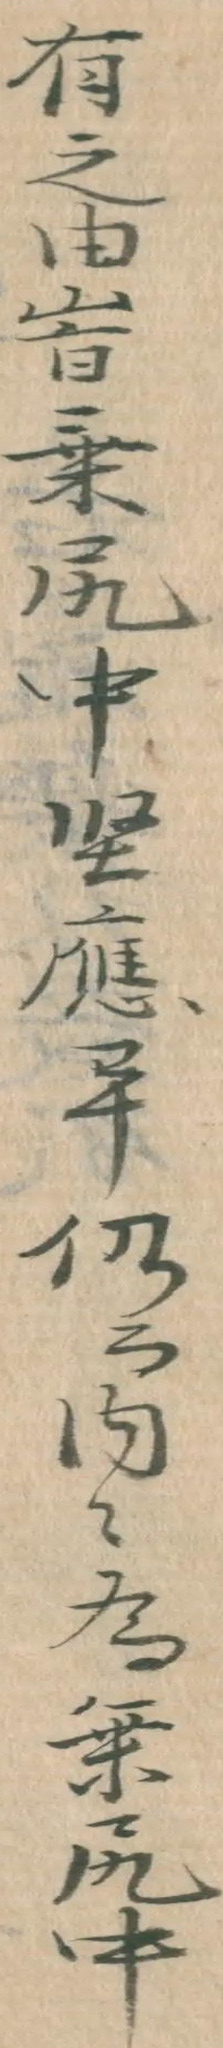有之由旹乗尻中堅応畢仍而内々為乗尻中
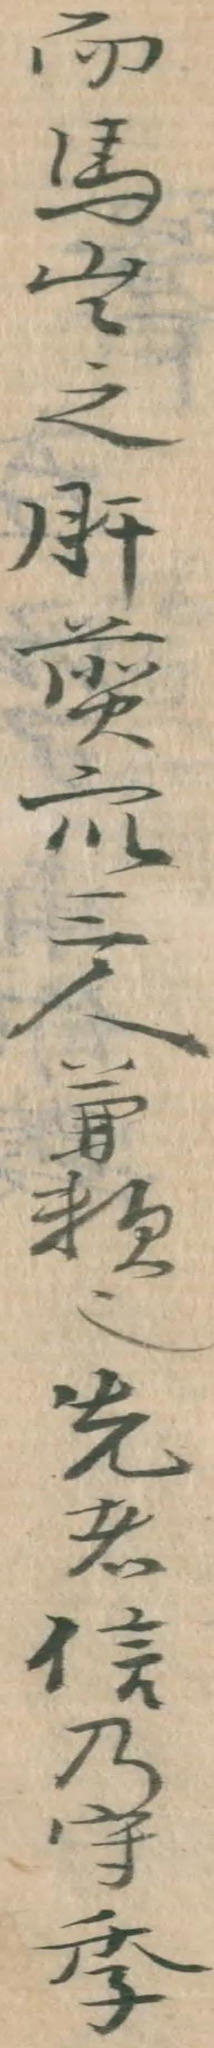而馬出之肝煎衆三人兼頼也先者信乃守季
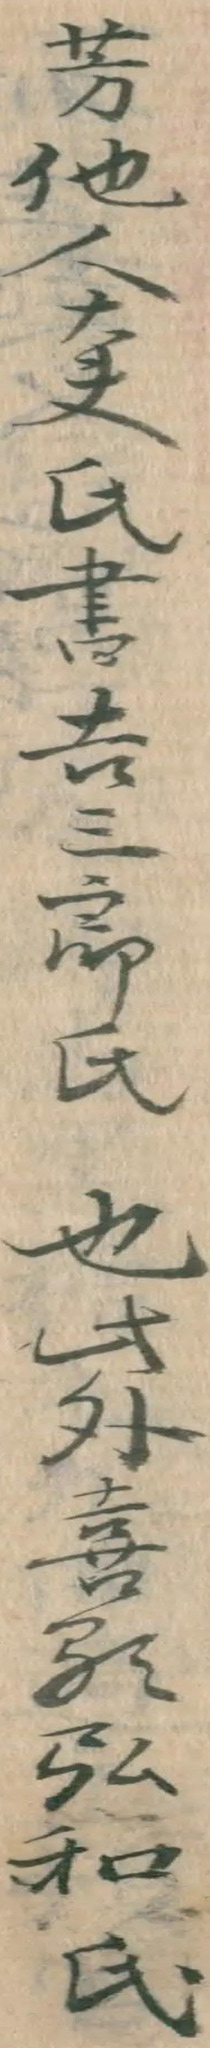芳他人大夫氏書吉三郎氏也此外喜顕弘和氏
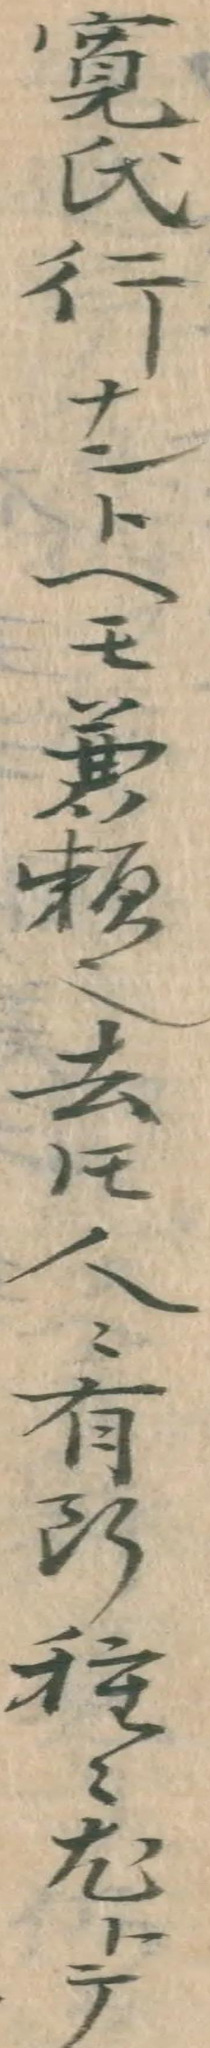寛氏行ナントヘモ兼頼也去トモ人々有断種々尤トテ
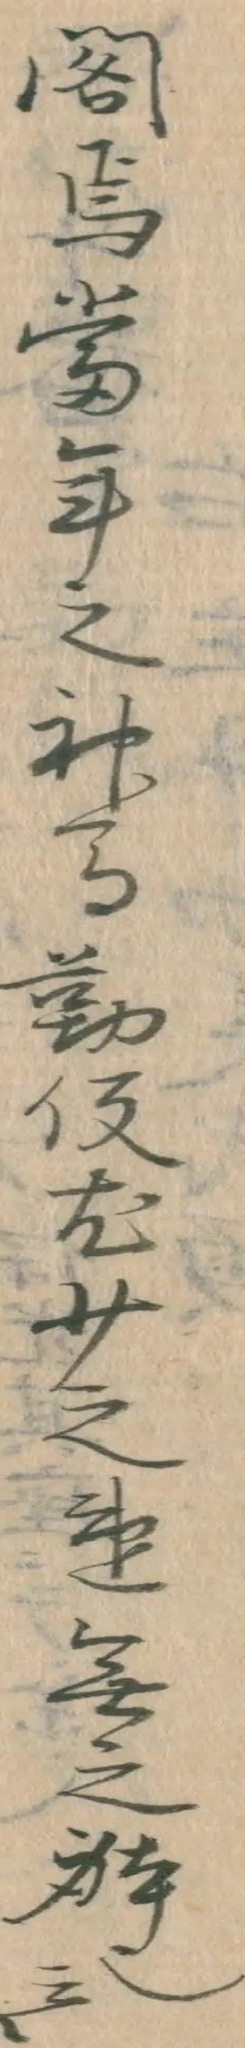閣焉当年之神馬勤役尤少之違無之体也云々
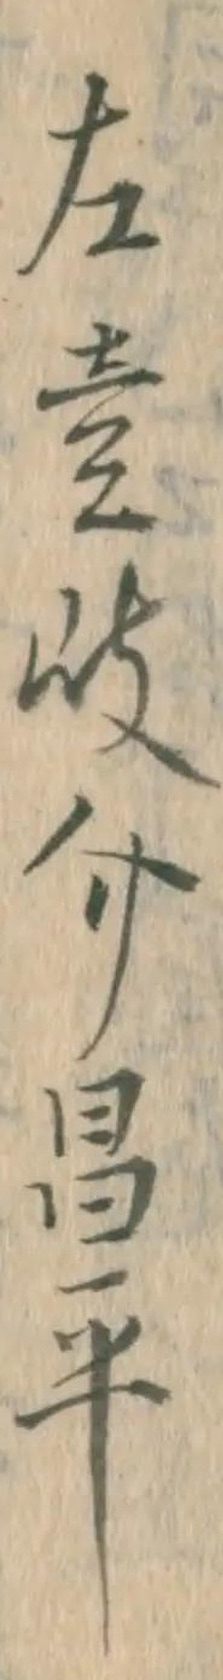左壱岐介昌平
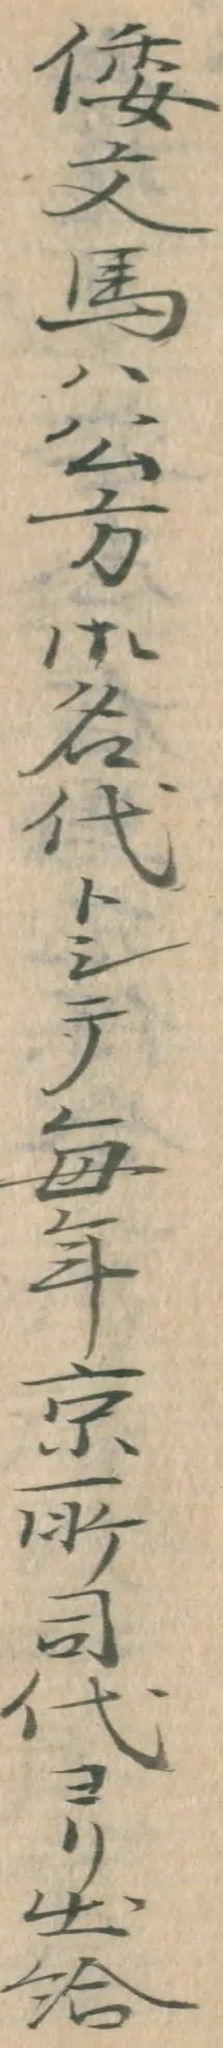倭文馬ハ公方御名代トシテ毎年京所司代ヨリ出給
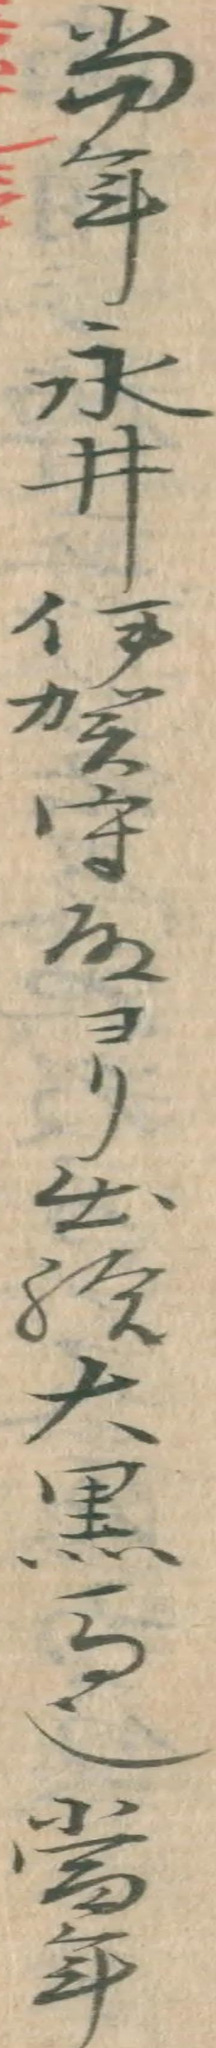当年永井伊賀守殿ヨリ出給大黒馬也当年
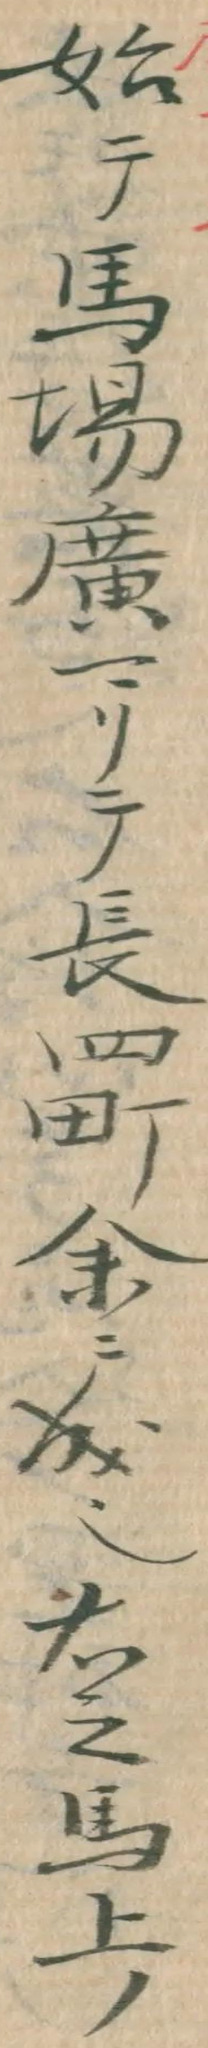始テ馬場広マリテ長四町余ニ成也右之馬上ノ
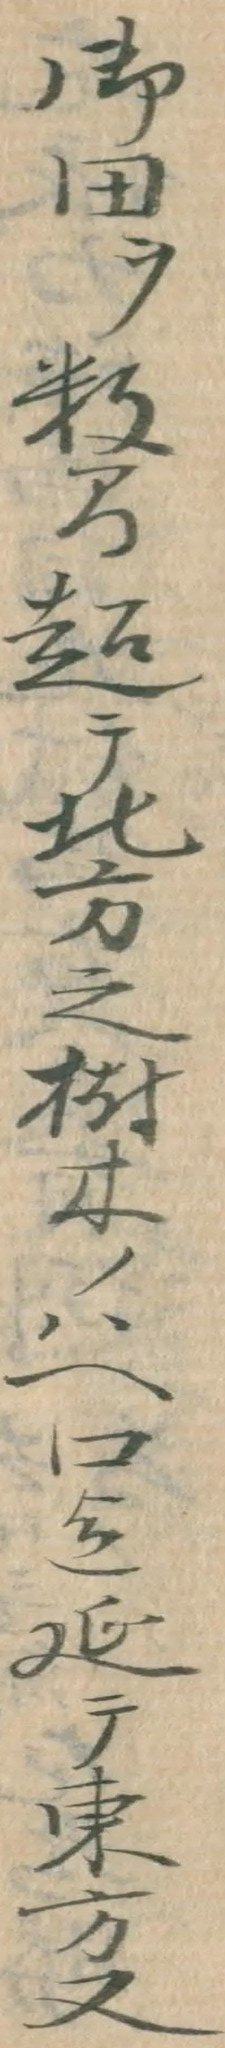御田ヲ数間超テ北方之樹木ノハへ口迄延テ東方又
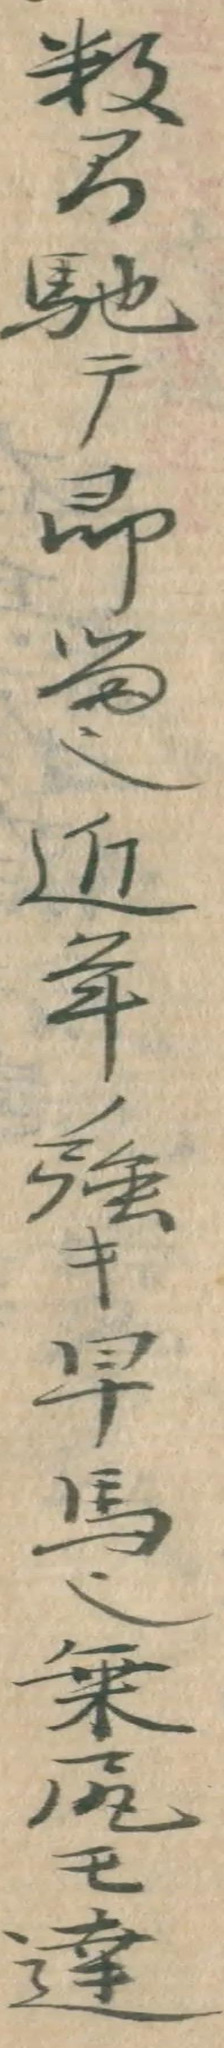数間馳テ即留也近年ノ強キ早馬也乗尻モ達
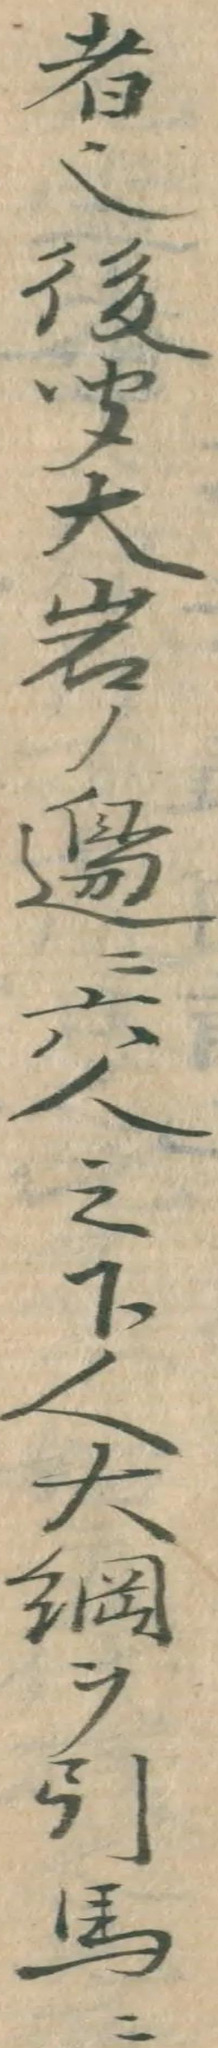者也後聞大岩ノ辺ニ六人之下人大綱ヲ引馬ニ
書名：賀茂社記録. 第10冊
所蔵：国立国会図書館 National Diet Library, JAPAN
